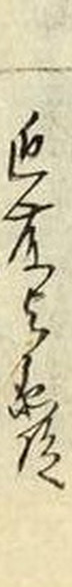近藤与兵衛殿
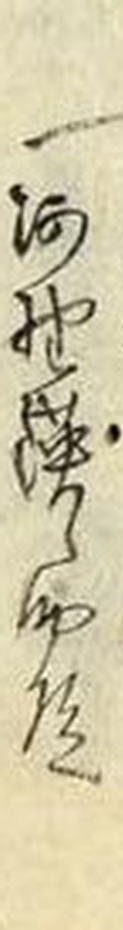河野鍈之助殿
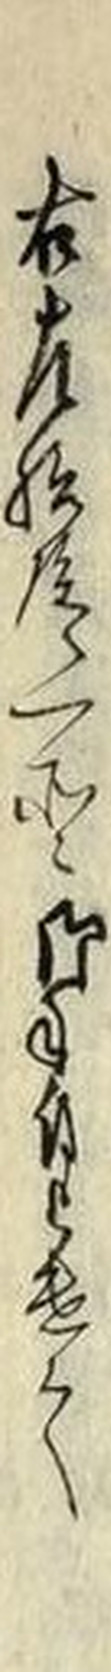右左善殿へ一所ニ御手自被遣之

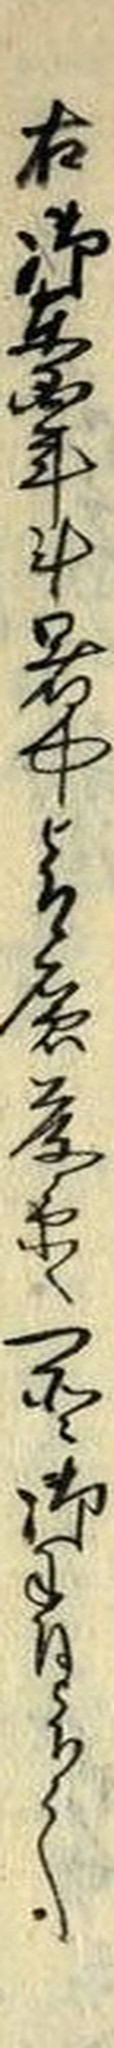右御在国年斗暑中被下候廉藤兵衛へ一所ニ御手自被下之
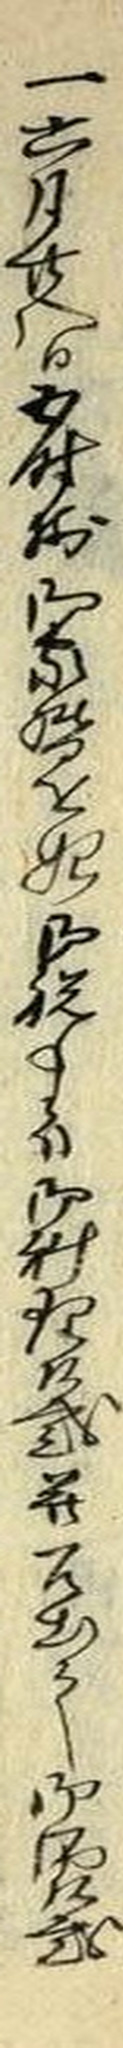一六月廿八日五時揃御家督を始御祝事ニ付御料理頂戴并召出之御酒頂戴
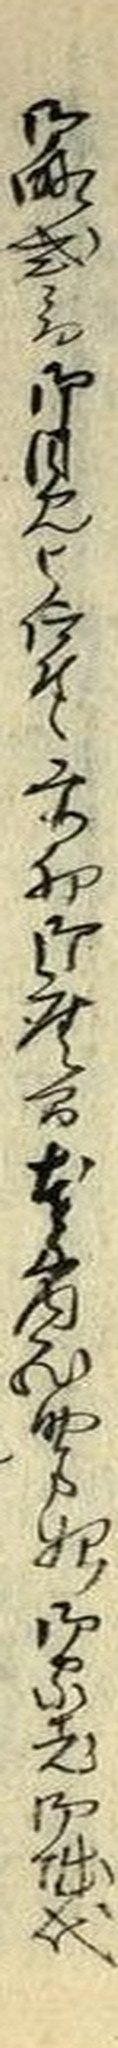御略式ニ而御目見被仰付候最初御座之間本多内蔵助方始御家老御城代
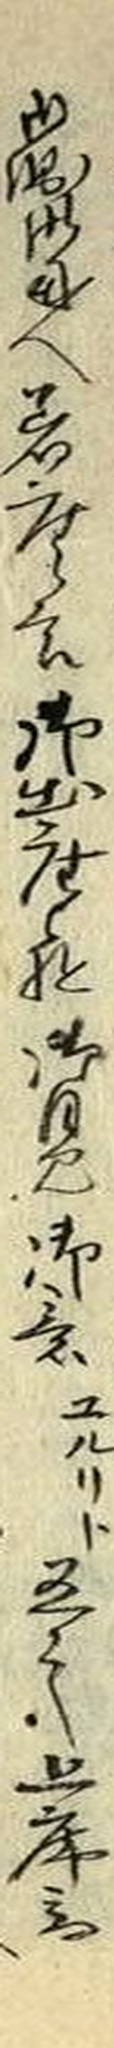御側御用人着座之節御出座被遊御目見御意ユルリト有之上席ニ而
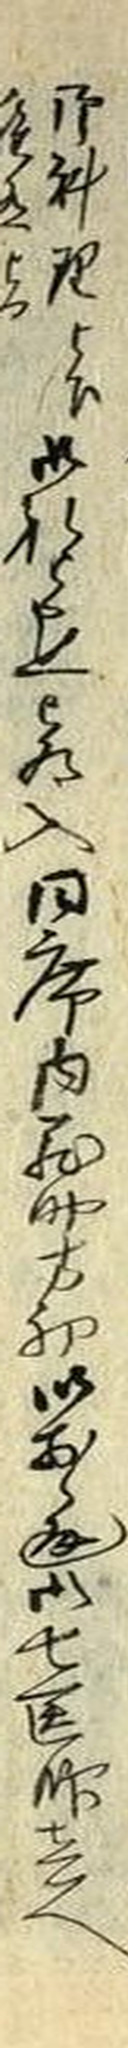御料理被下難有旨御礼被申上被為入同席内蔵助方初以前之通御匕医師壱人
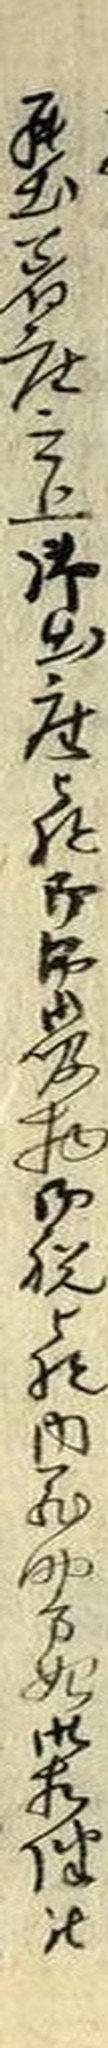罷出着座之上御出座被遊御酒御吸物御祝被遊内蔵助方始御相伴被
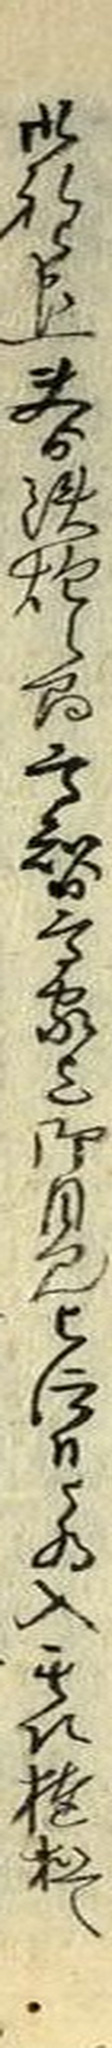御礼被申上夫ゟ鉄炮之間高知ゟ高家迄御目見被仰付被為入其次韃靼之
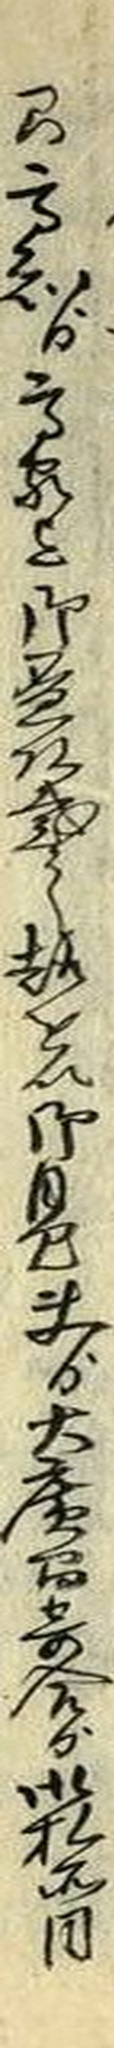間高知ゟ高家迄御盃頂戴之趣を以御目見夫ゟ大広間寄合ゟ御札所目
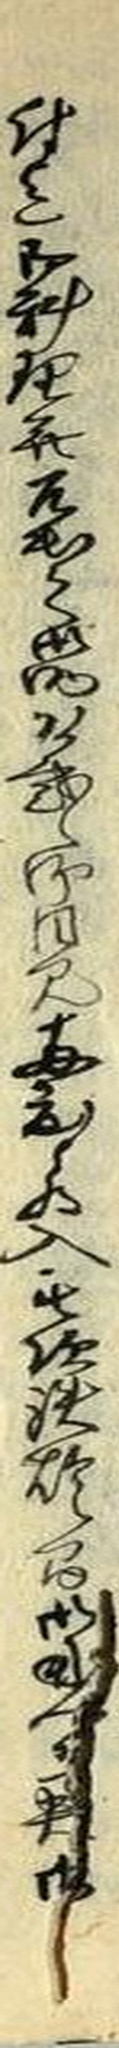付迄御料理并召出之御酒頂戴之御目見両度被為入其次鉄炮之間御用人ゟ奥御
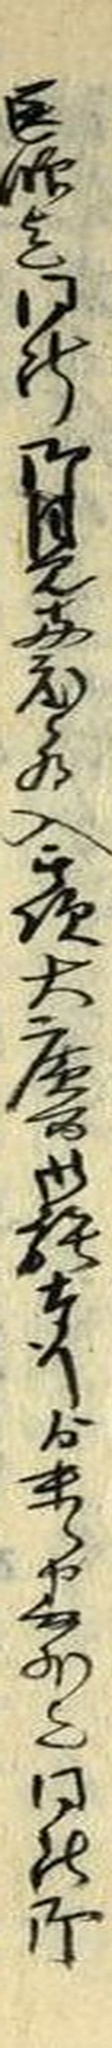医師迄同断御目見両度被為入其次大広間御旗奉行ゟ未之番外迄同断御
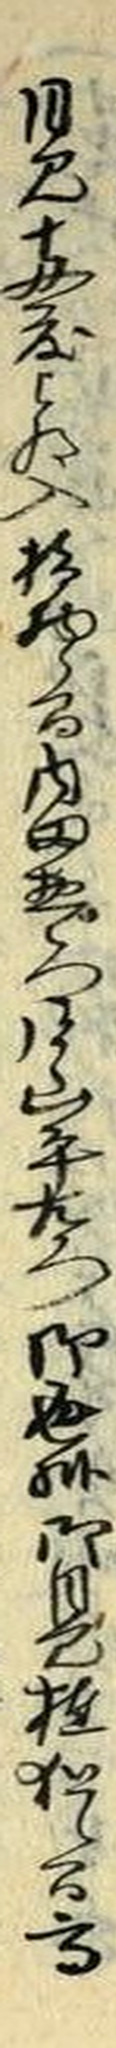目見両度被為入指物之間内田惣右衛門片山平左衛門御通掛御目見韃靼之間高
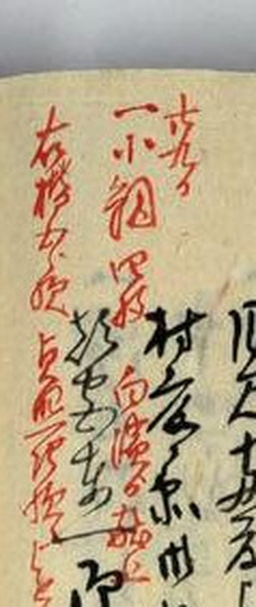一小鯛四枚白浜ゟ献上
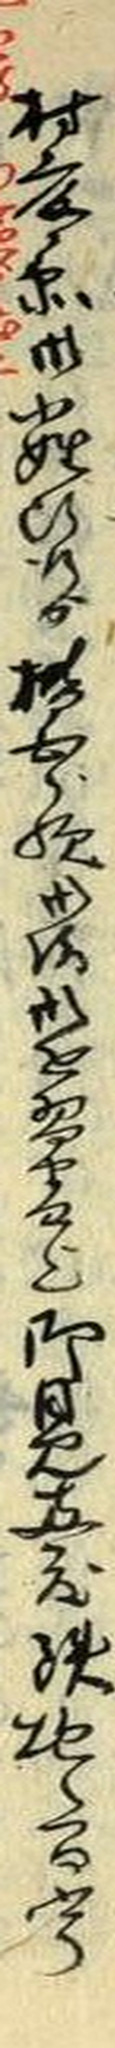村藤兵衛御小姓頭取ゟ楷五郎様御附御近習番迄御目見両度鉄炮之間宇
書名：少傅日録抄（斉善付側向頭取日記、江戸并道中、初入在国、逝去後…
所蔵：福井県文書館 Fukui Prefectural Archives
